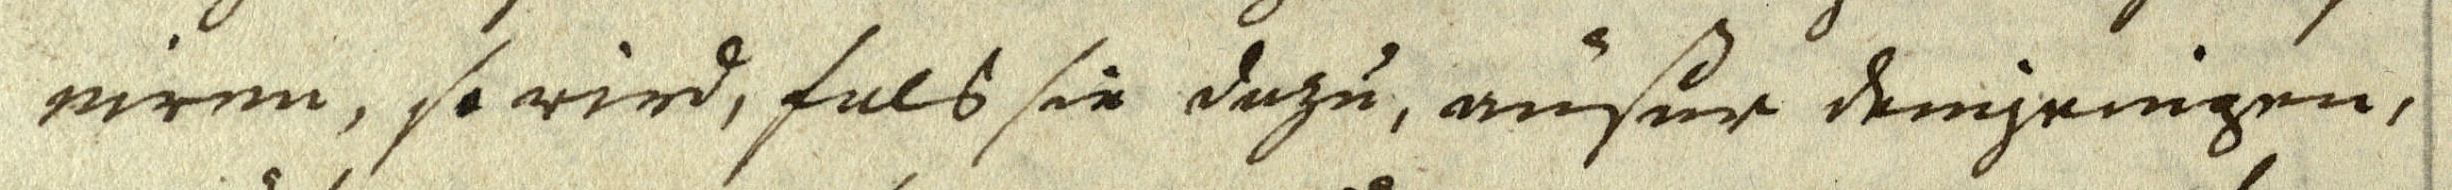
niren, so wird, fals sie dazu, außer demjenigen,
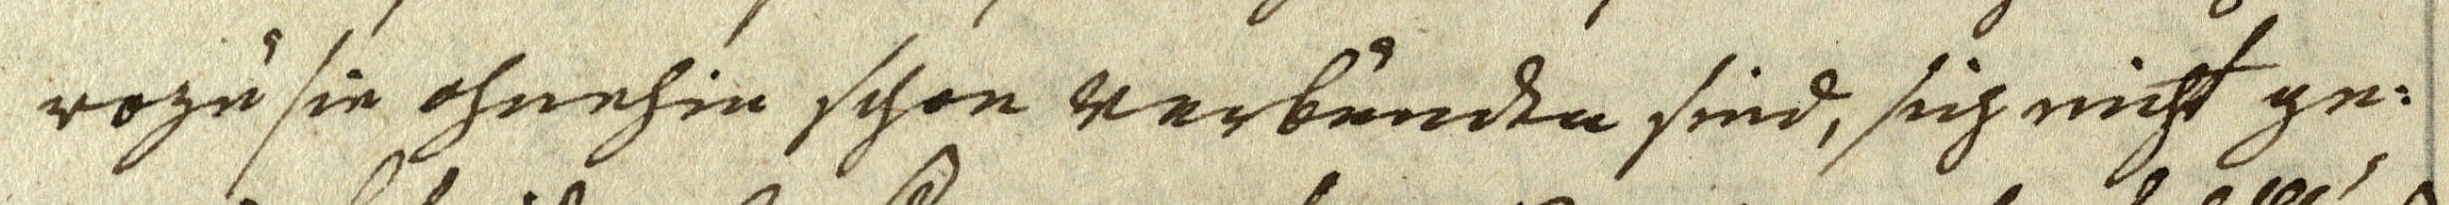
wozu sie ohnehin schon verbunden sind, sich nicht ge¬
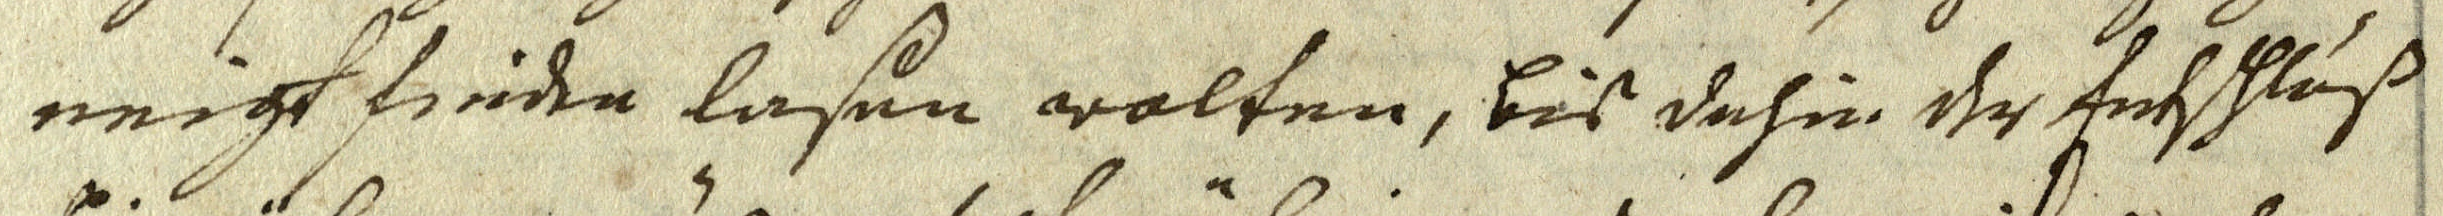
neigt finden laßen wolten, bis dahin der Entschluß
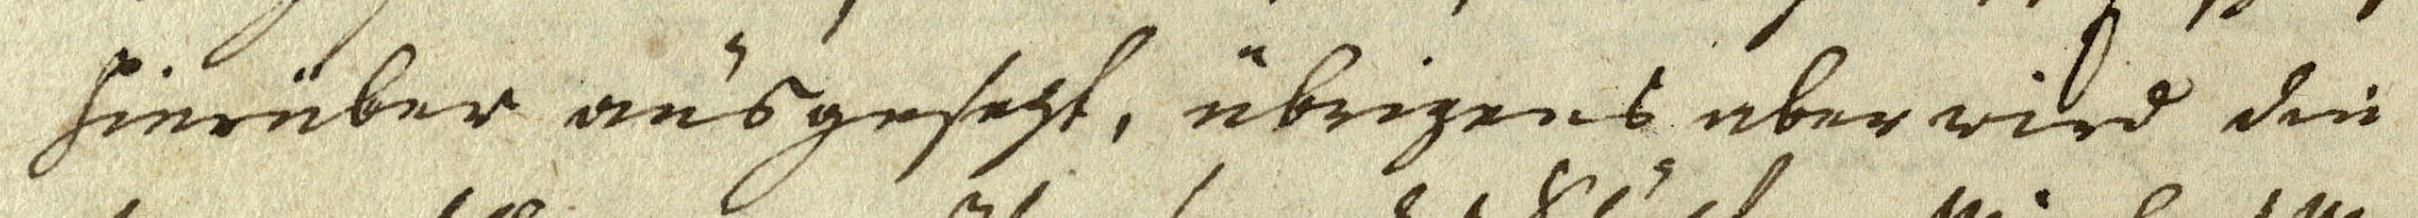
hierüber ausgesezt, übrigens aber wird die
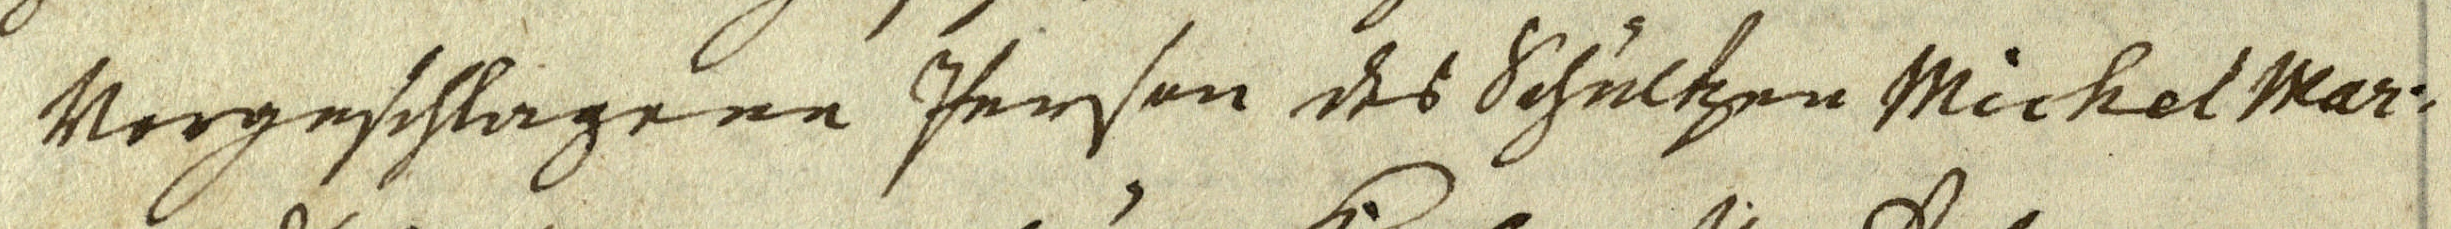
vorgeschlagene Person des Schultzen Michel Mar¬
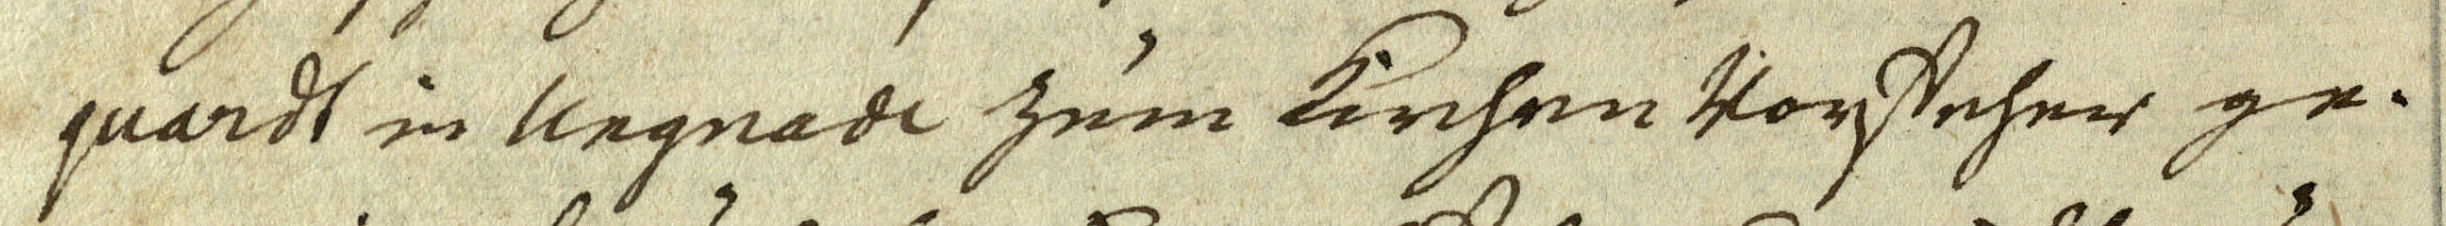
quardt in Ungnade zum Kirchen Vorsteher ge¬
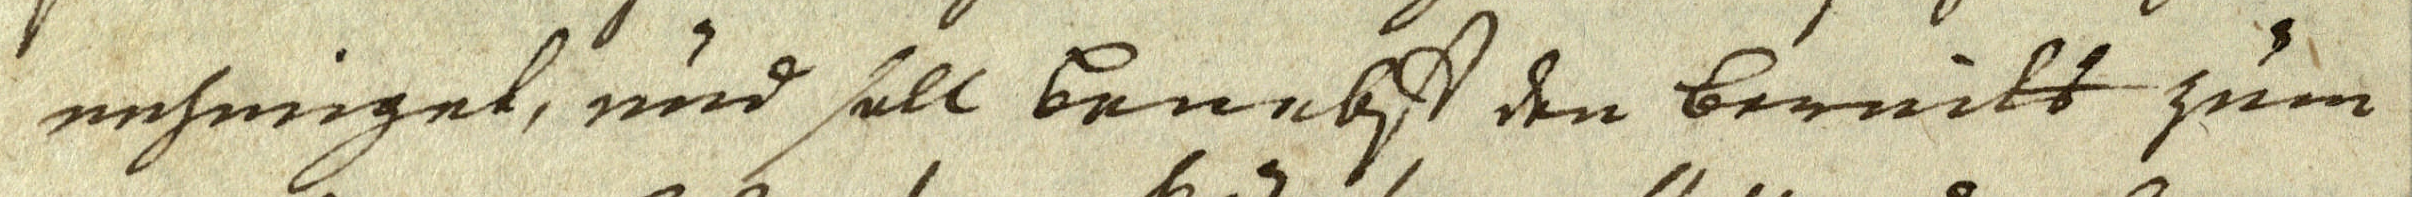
nehmiget, und soll benebst den bereits zum
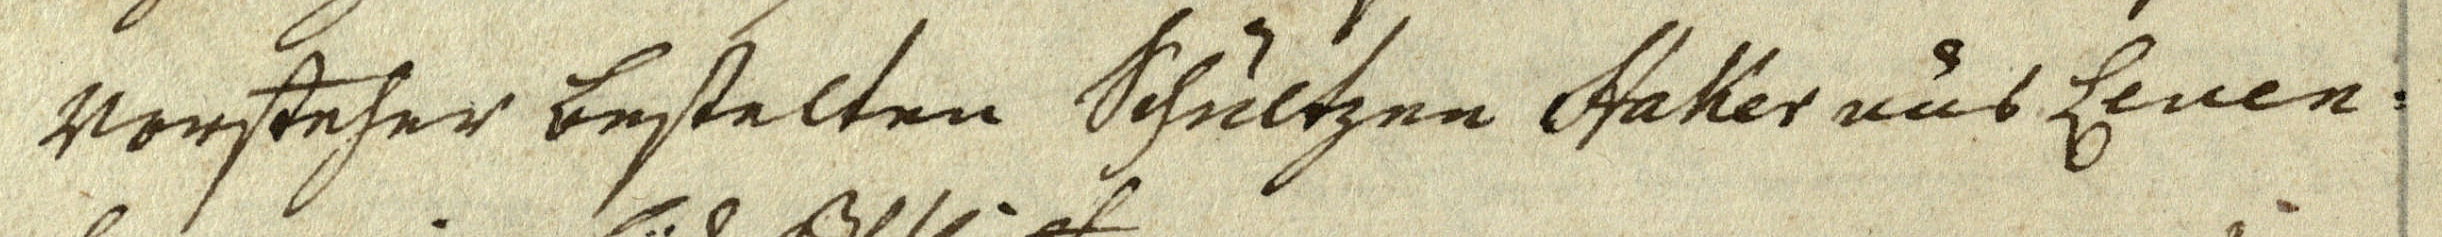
Vorsteher bestelten Schultzen Haker aus Leven¬
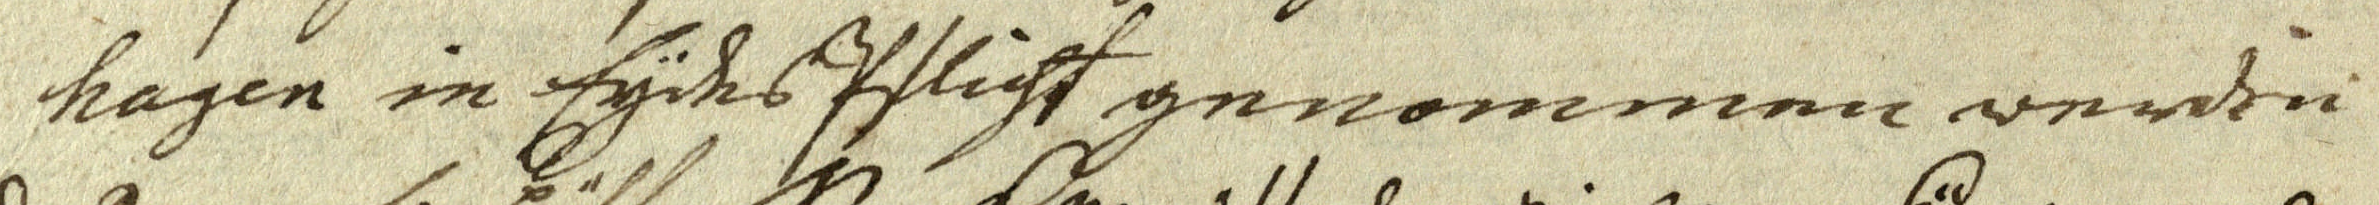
hagen die Eÿdes Pflicht genommen werden.
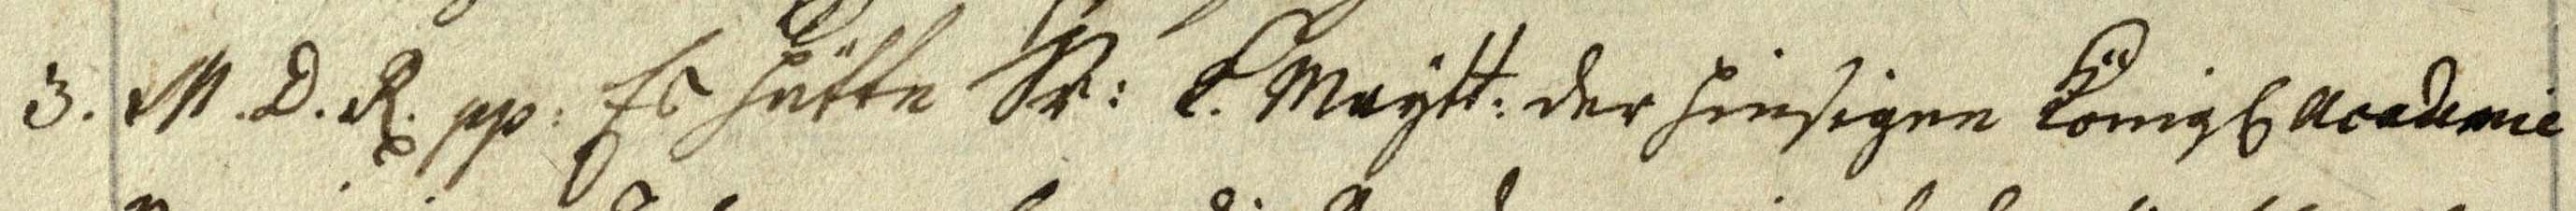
M. D. R. pp. Es hätte Sr K. Maÿtt. der hiesigen Königl. Academie
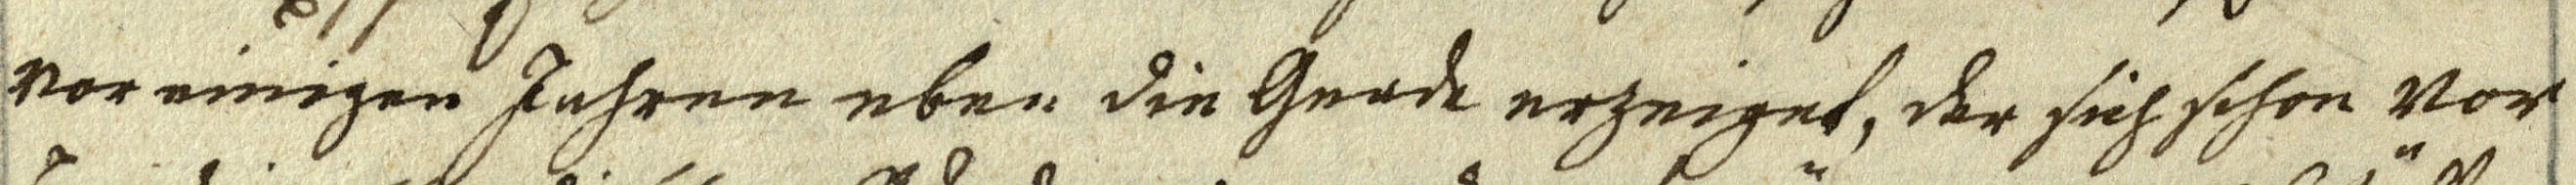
vor einigen Jahren eben die Gnade erzeiget, der sich schon vor¬
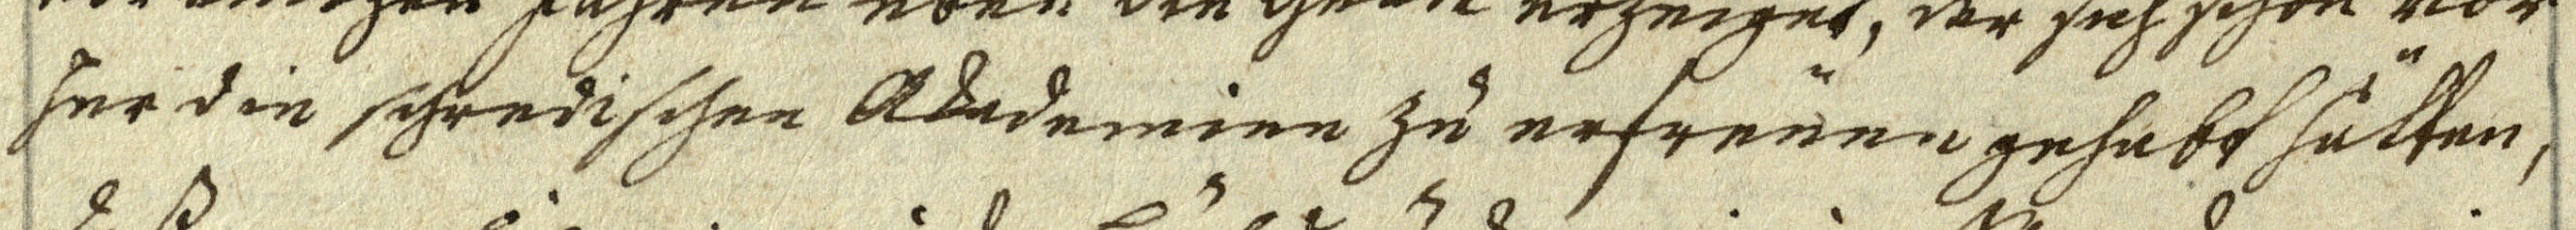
her die schwedischen Academien zu erfreuen gehabt hätten,
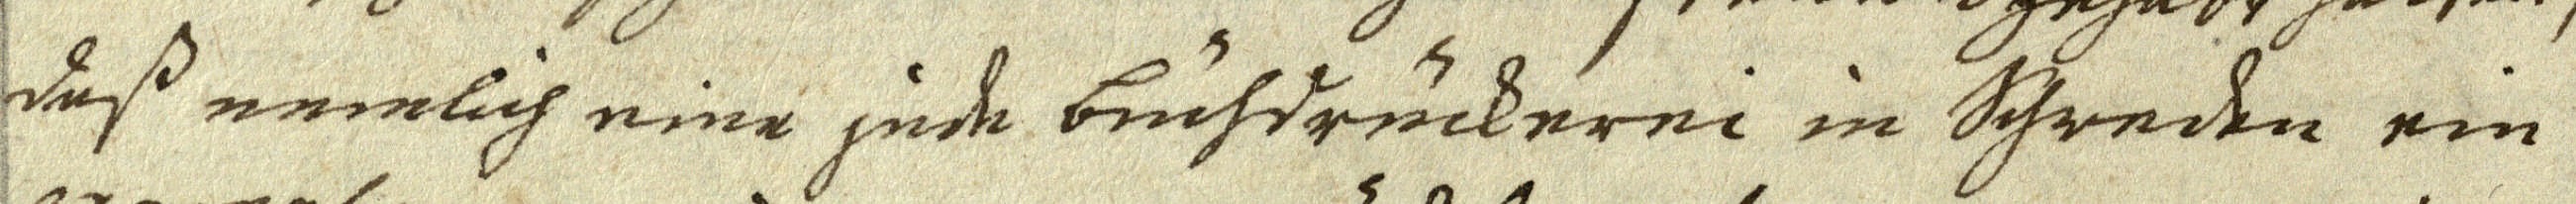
daß nemlich eine jede Buchdruckerei in Schweden ein
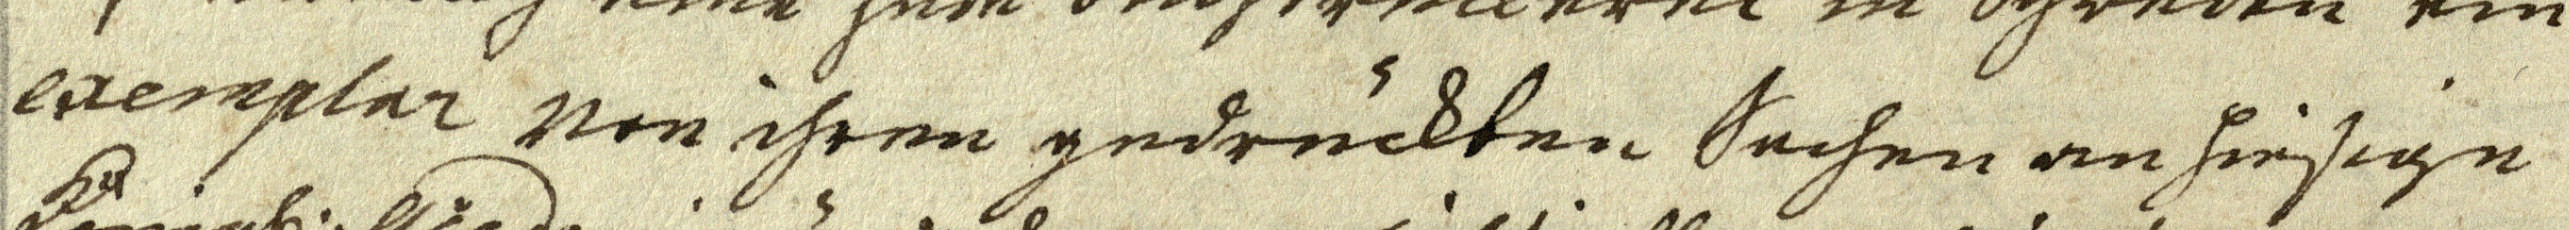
exemplar von ihren geduckten Sachen an hiesige
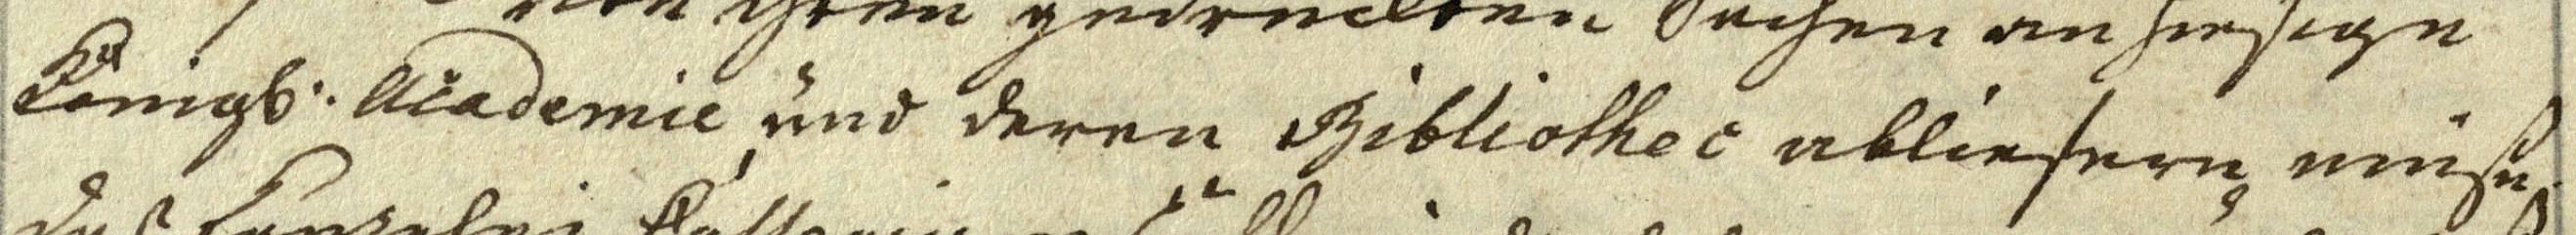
Königl. Academie und deren Bibliothec abliefern müße.
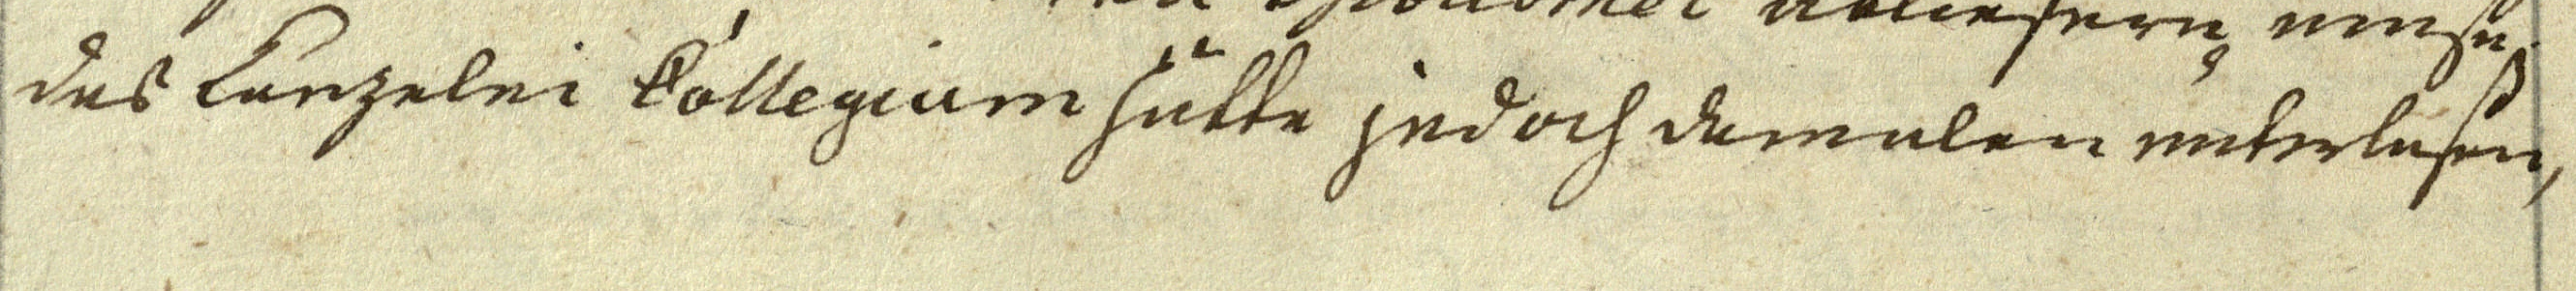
Das Canzelei Collegium hätte jedoch damalen unterlaßen,
